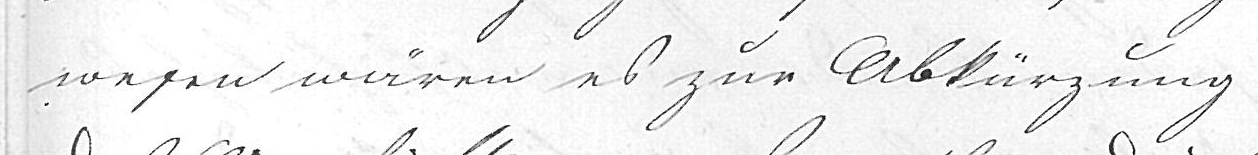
wesen wären es zur Abkürzung
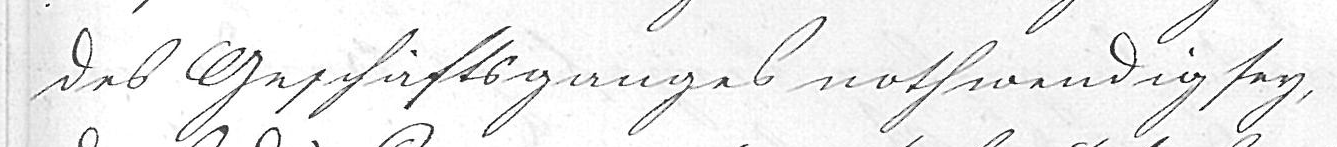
des Geschäftsganges nothwendig sey,
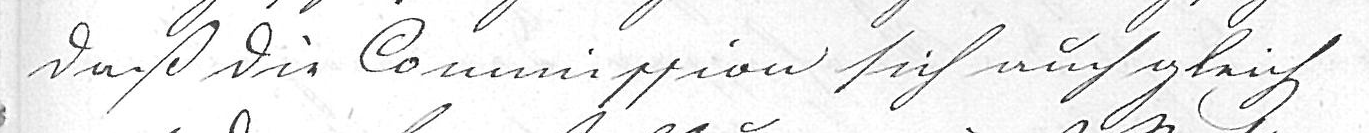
daß die Commission sich auch gleich
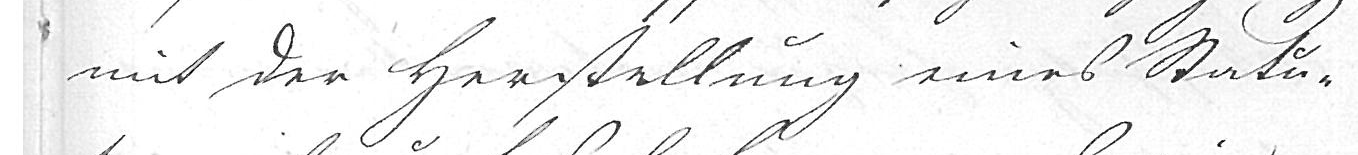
mit der Herstellung eines Statu-
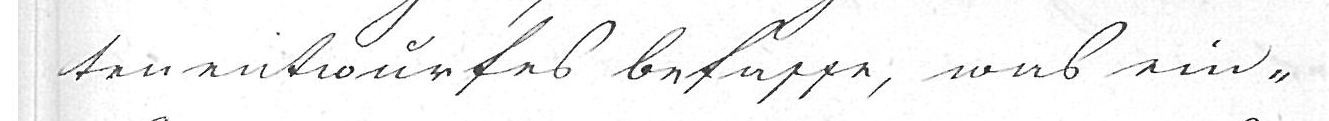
tenentwurfes befasse, was ein-
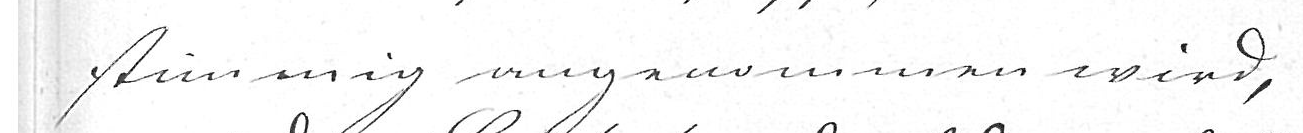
stimmig angenommen wird,
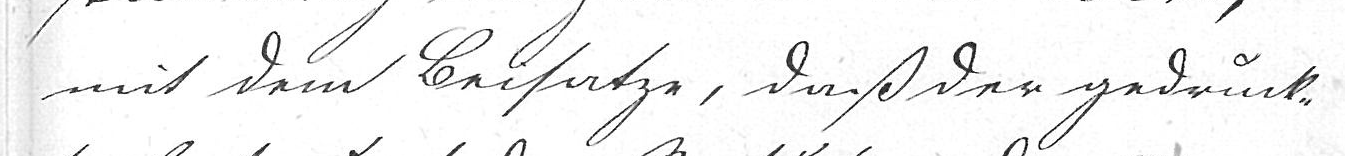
mit die Beisatze, daß der gedruck-
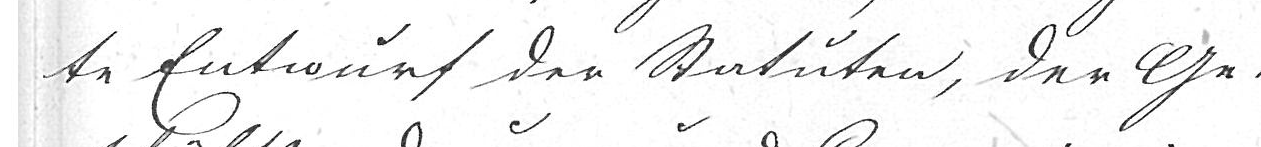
te Entwurf der Statuten, der Ge-
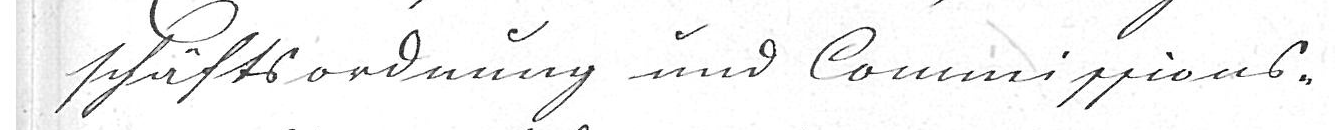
schäftsordnung und Commissions-
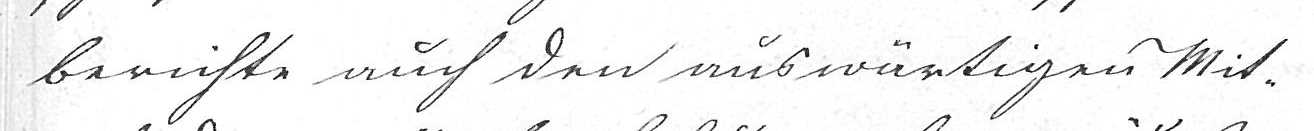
berichte auch den auswärtigen Mit-
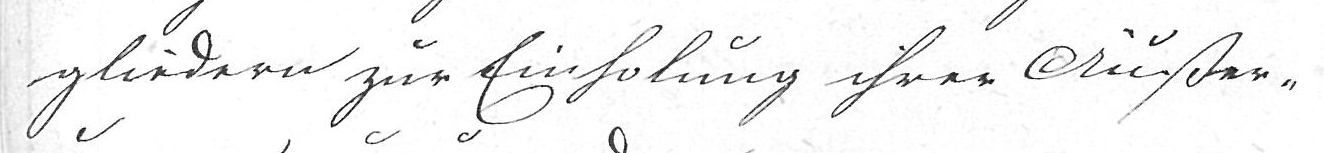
gliedern zur Einholung ihrer Äußer-
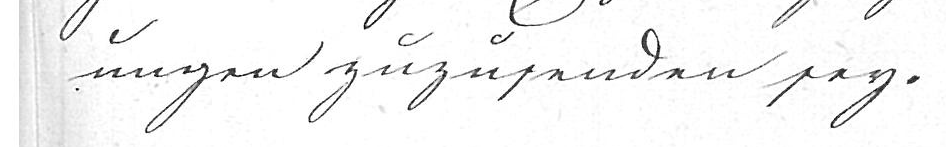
ungen zuzusenden sey.
